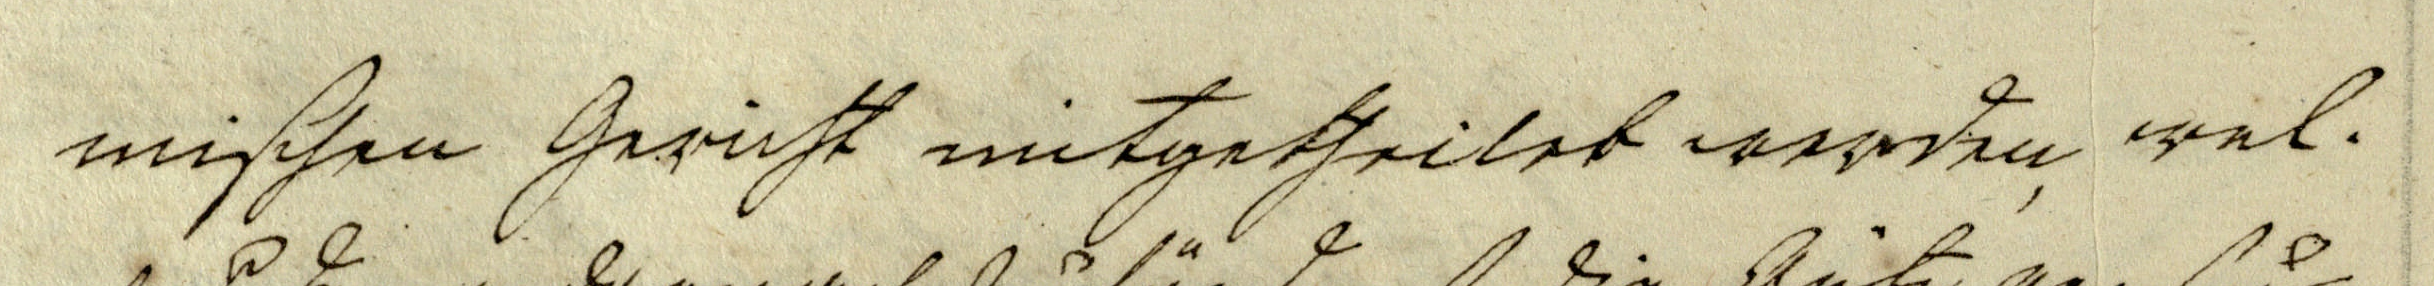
mischen Gericht mitgetheilet werden, wel
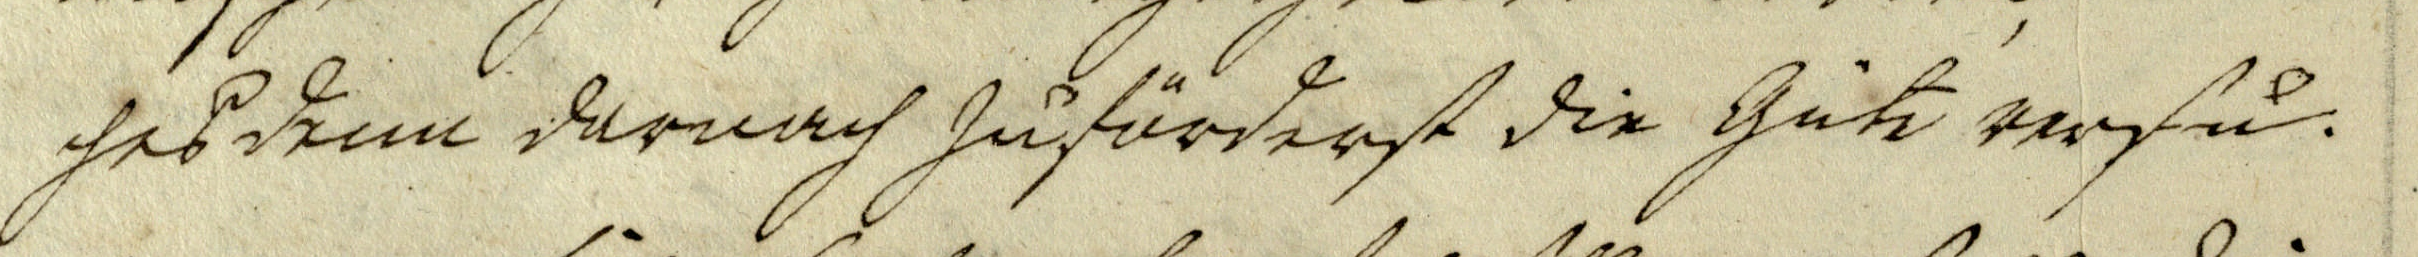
ches denn darnach zuförderst die Güte versu¬
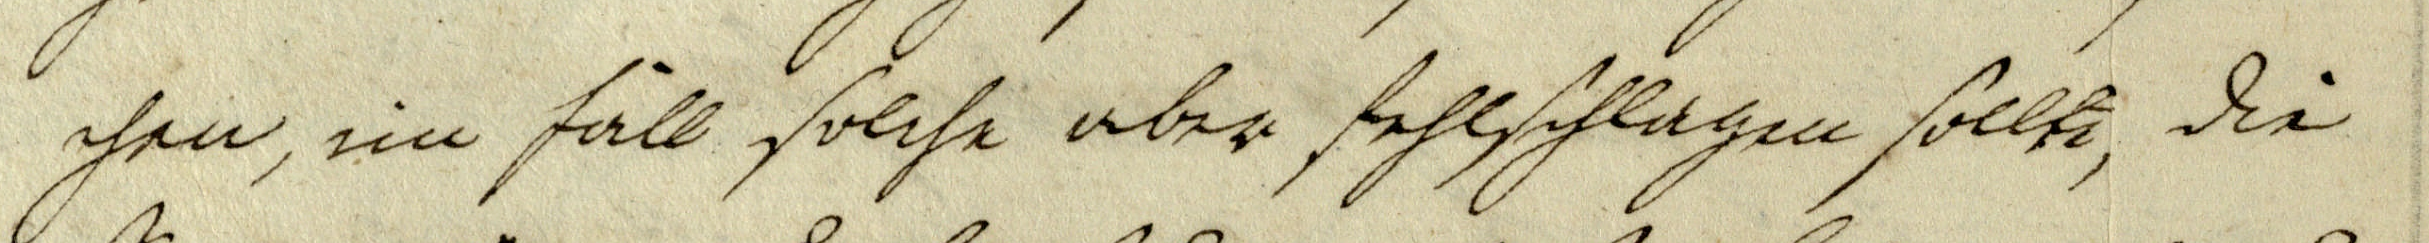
chen, im Fall solche aber fehlschlagen sollte, die
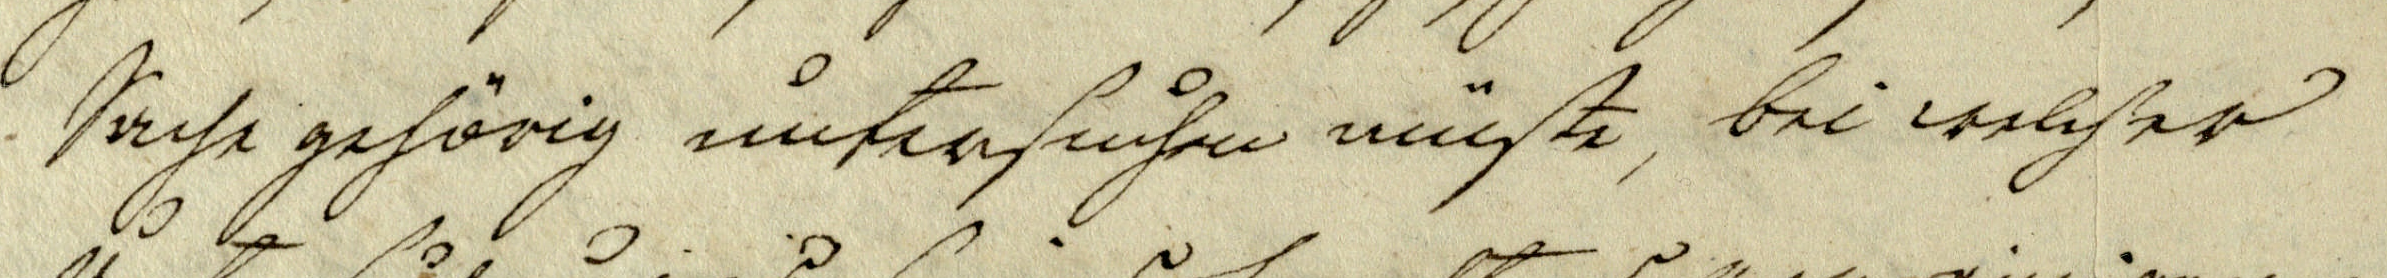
Sache gehörig untersuchen müßte, bei welcher
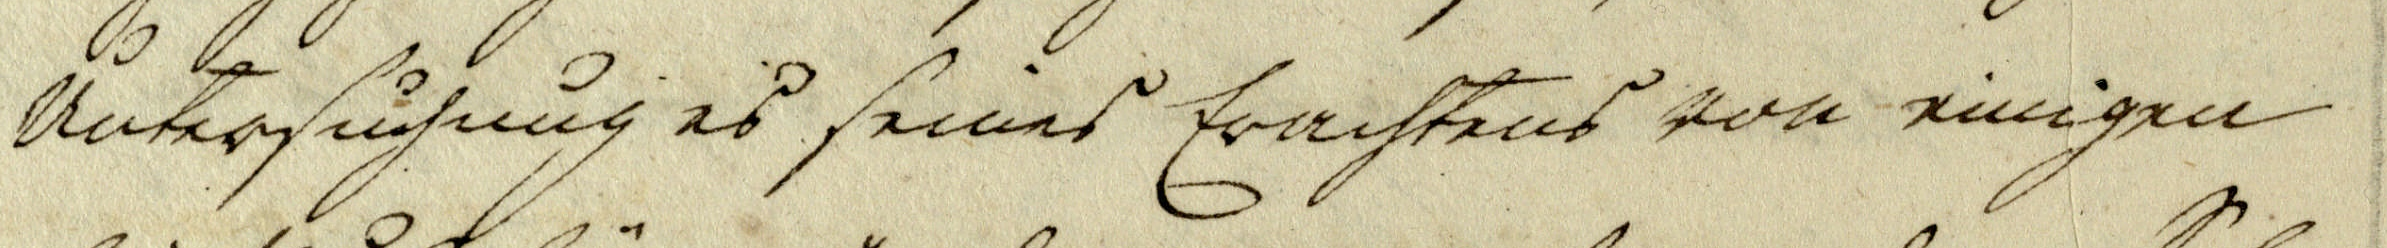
Untersuchung es seines Erachtens von einigen
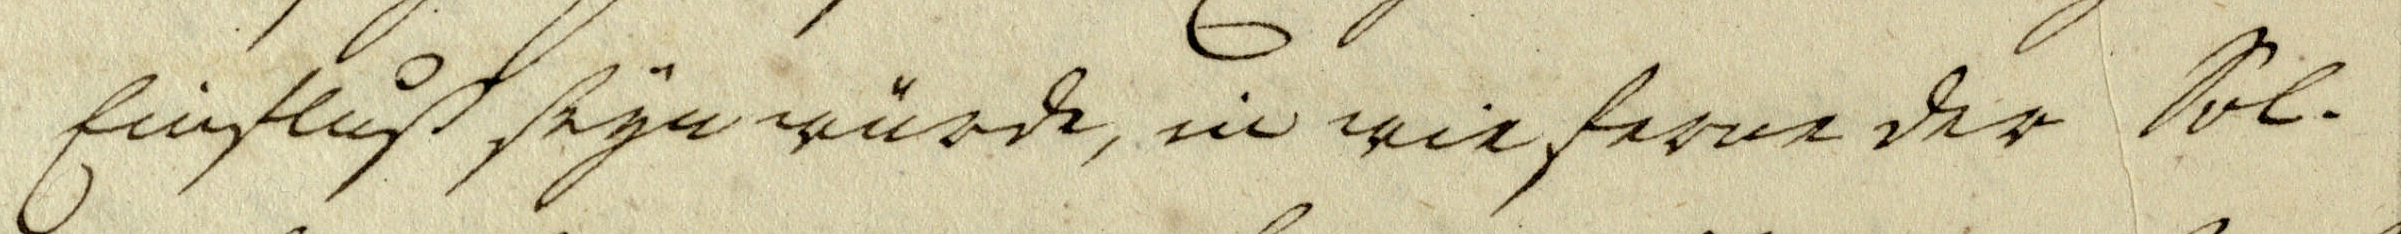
Einfluß seÿn würde, in wie ferne der Sol¬
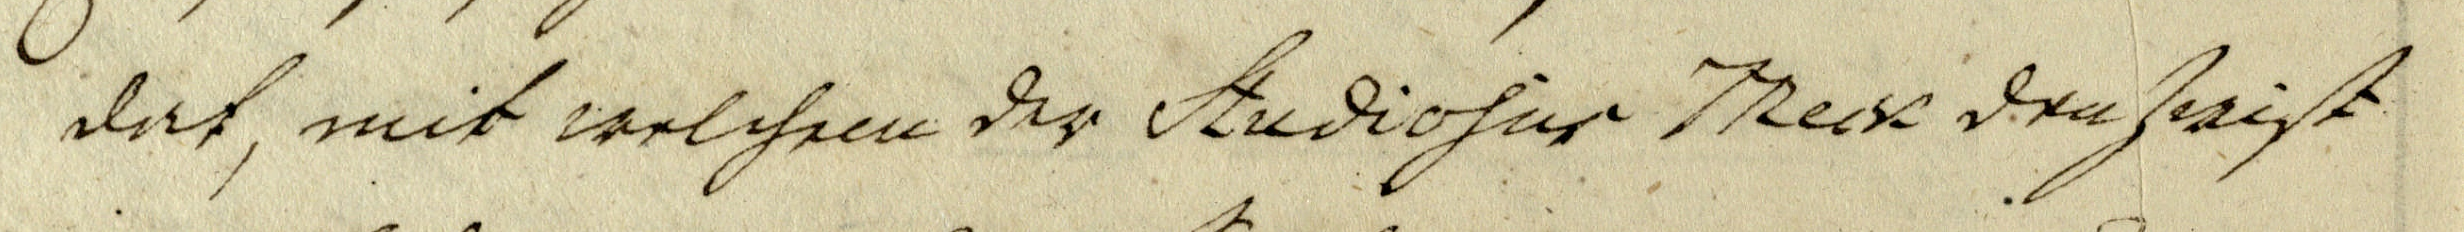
dat, mit welchem der Studiosus Meck den Zwist
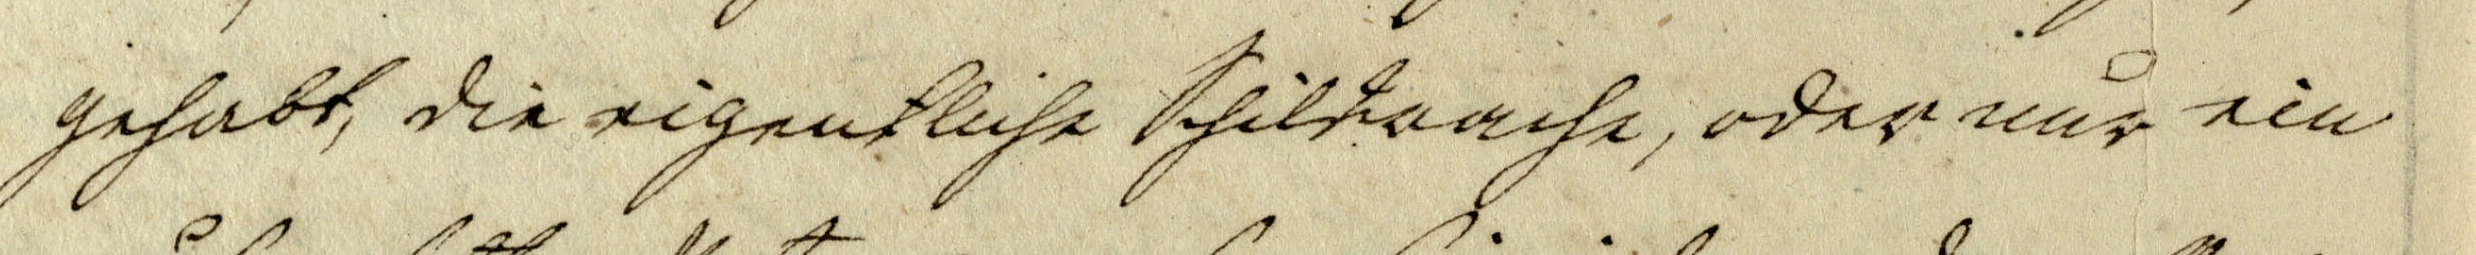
gehabt, die eigentliche Schildwache, oder nur ein
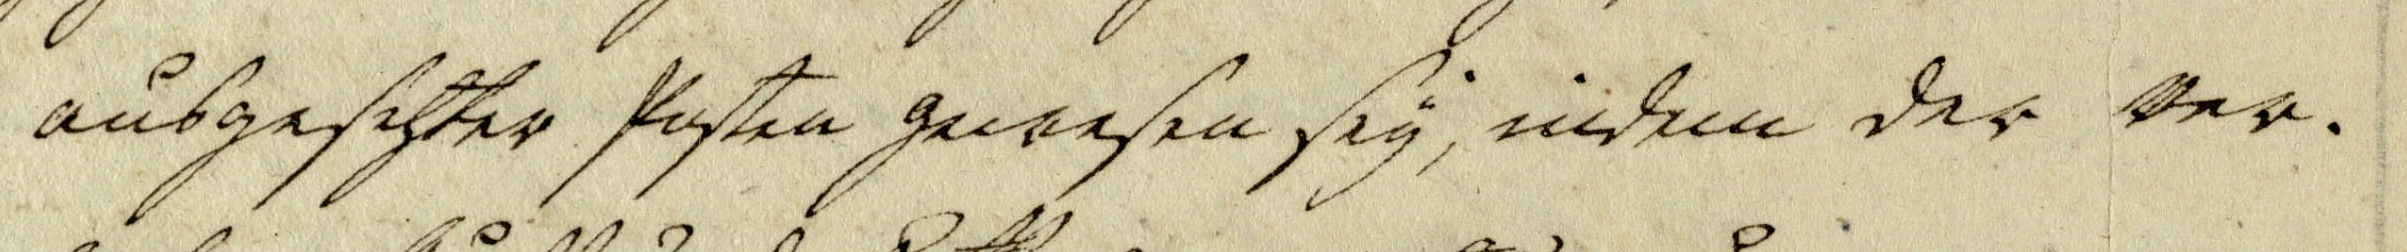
ausgesetzter Posten gewesen seÿ, indem der ver¬
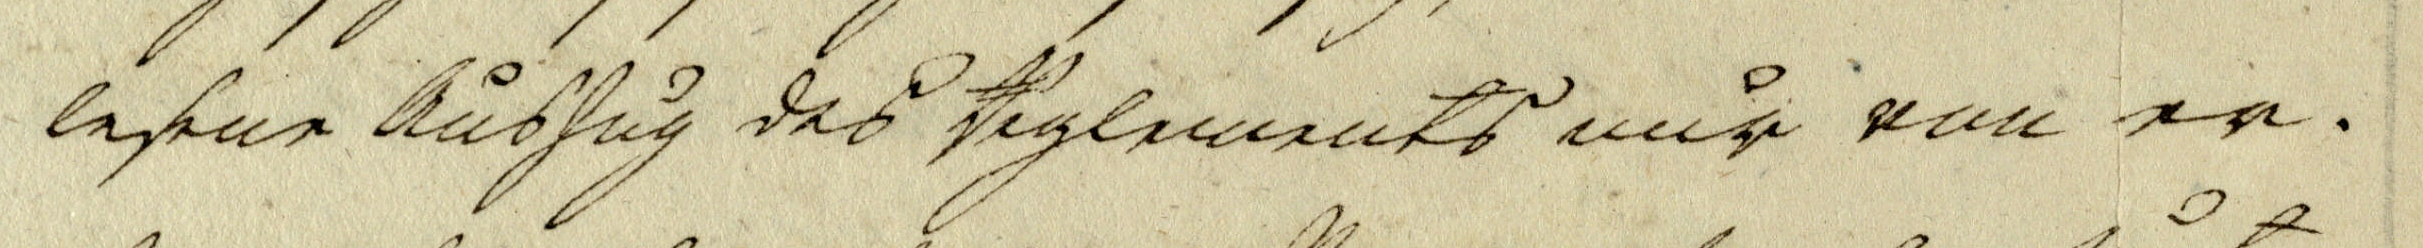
lesene Auszug des Reglements nur von er¬
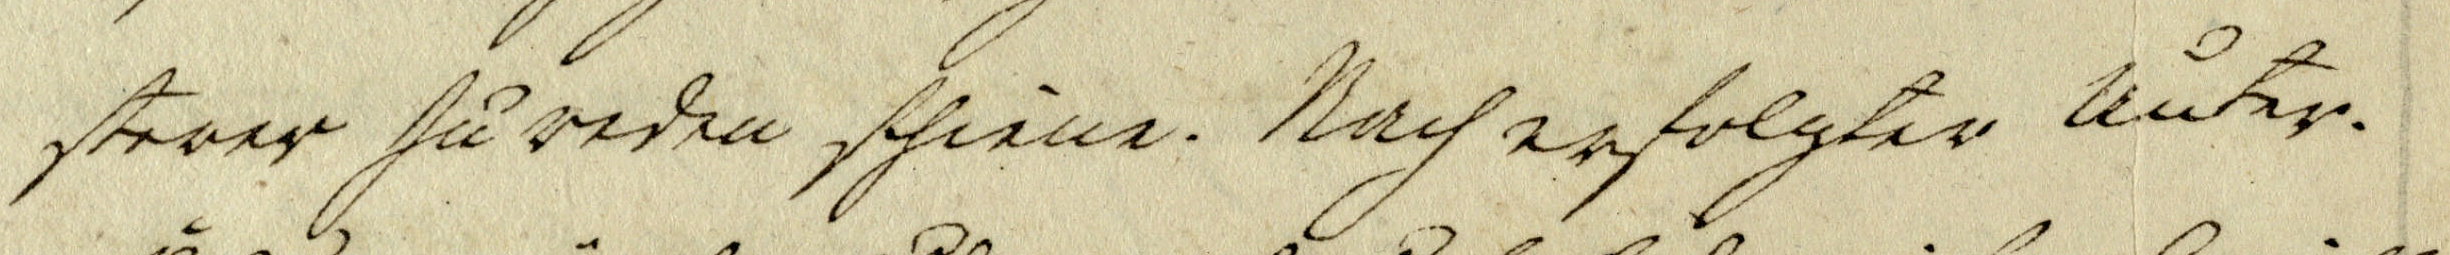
sterer zu reden schiene. Nach erfolgter Unter¬
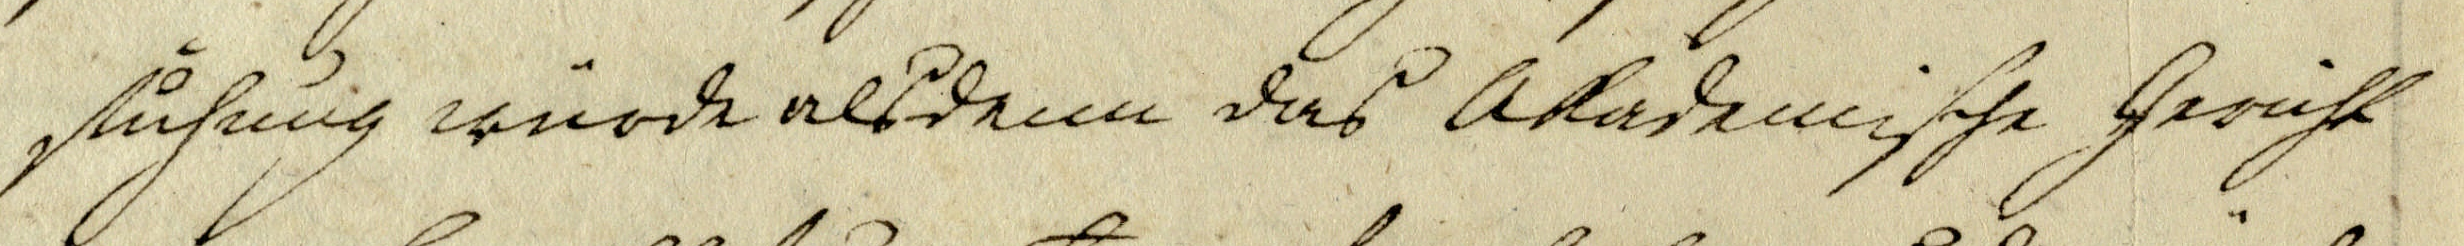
suchung würde alsdenn das Akademische Gericht
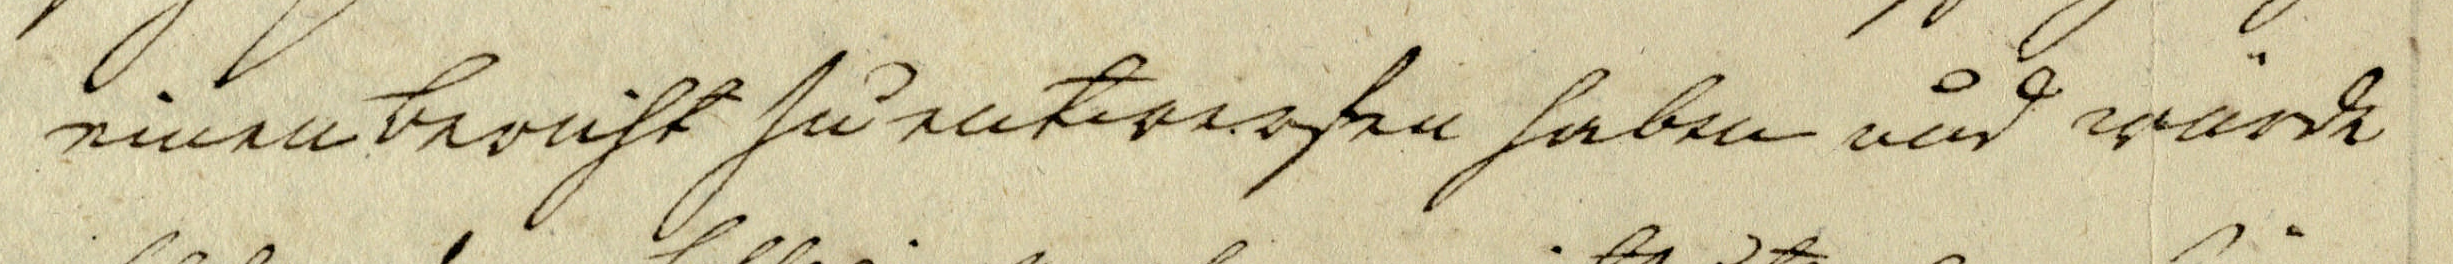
einen Bericht zu entwerfen haben und würde
